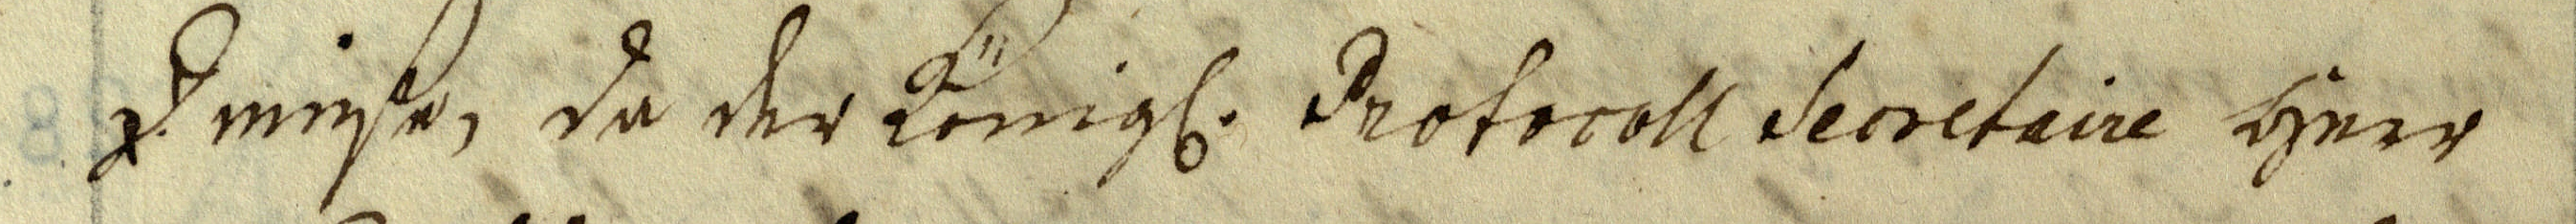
müße, da der Königl. Protocoll Secretaire Herr
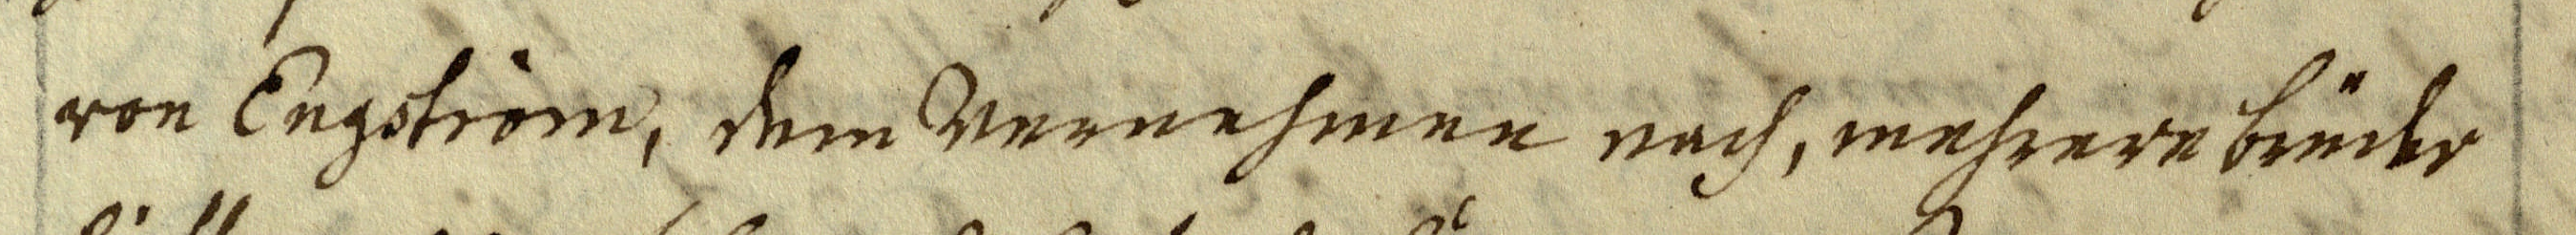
von Engstzröm, dem Vernehmen nach, mehrere Brüder
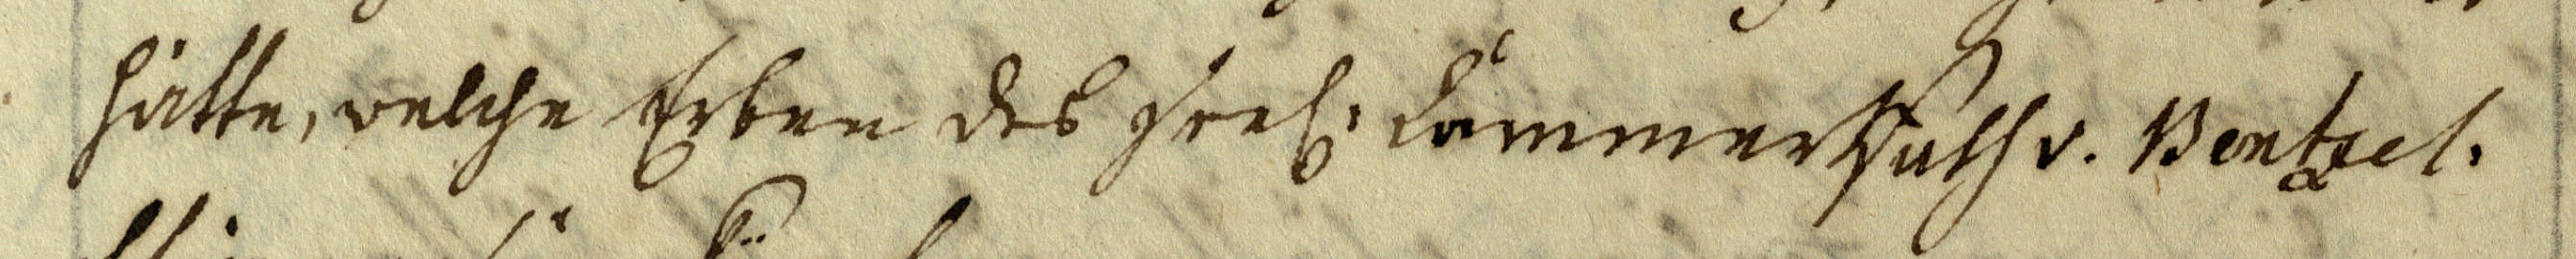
hätte, welche Erben des seel. CammerRath v. Bentzel¬
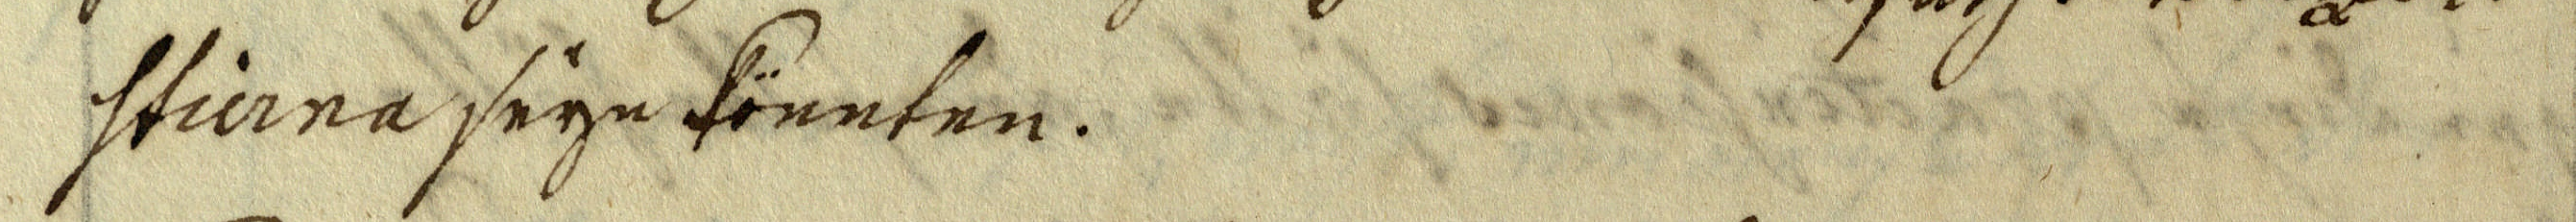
stierna seÿn könnten.
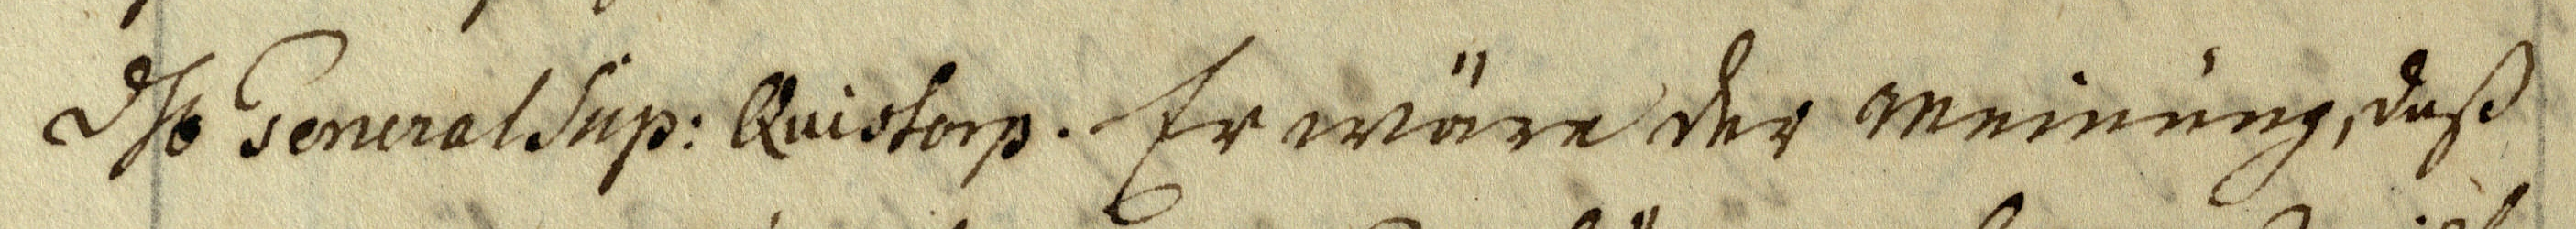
dh GeneralSup. Quistorp. Er wäre der Meinung, daß
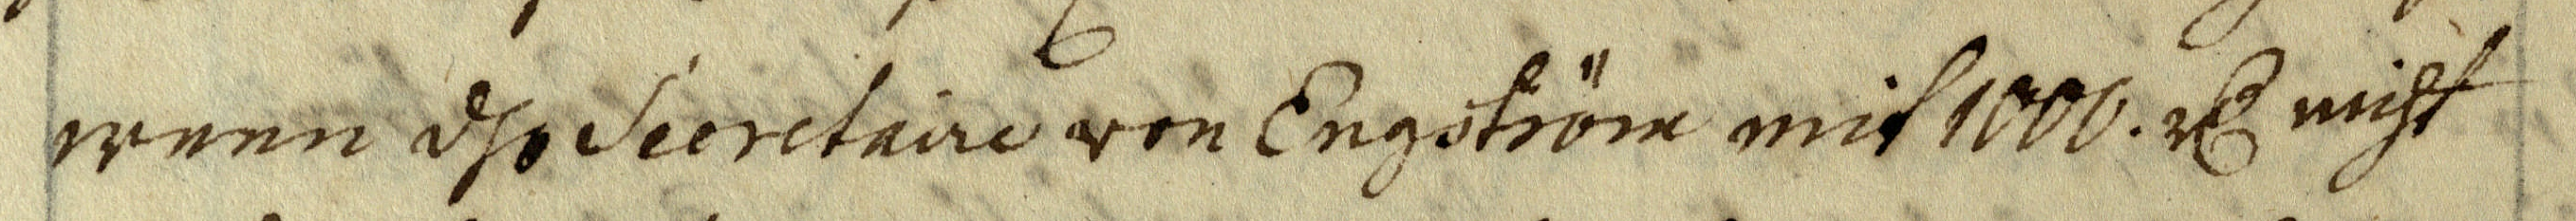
wenn dh Secretaire von Engström mit 1000 r. nicht
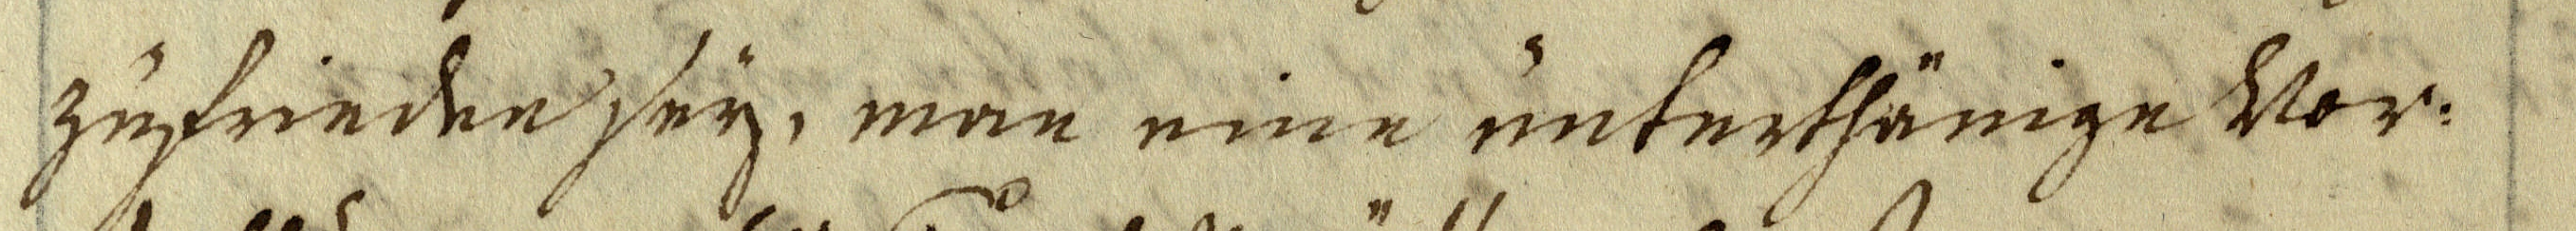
zufrieden seÿ, man eine unterthänige Vor¬
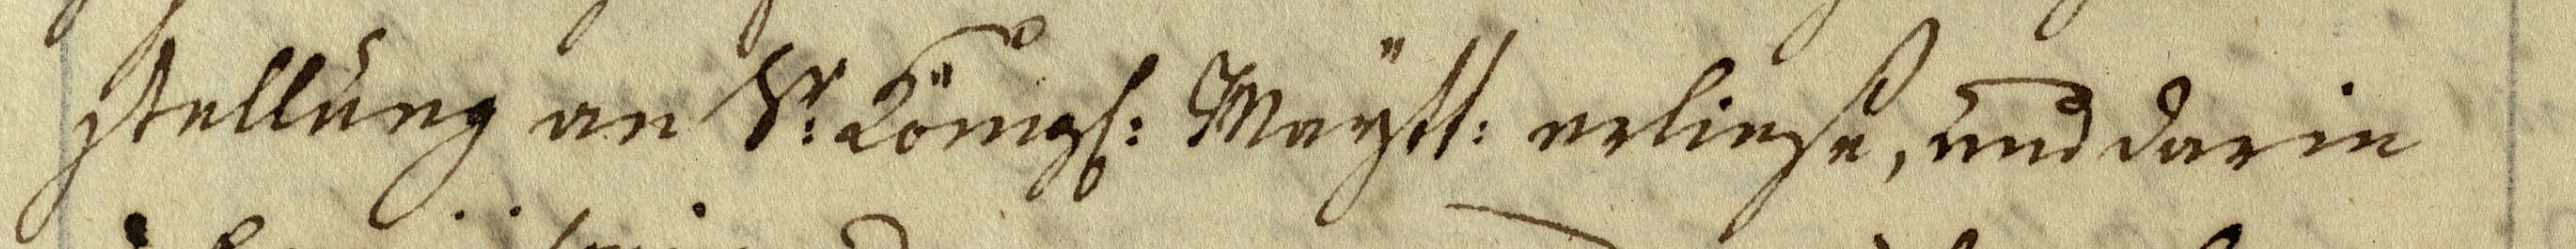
stellung an S. Königl. Maÿtt. erließe, und darin
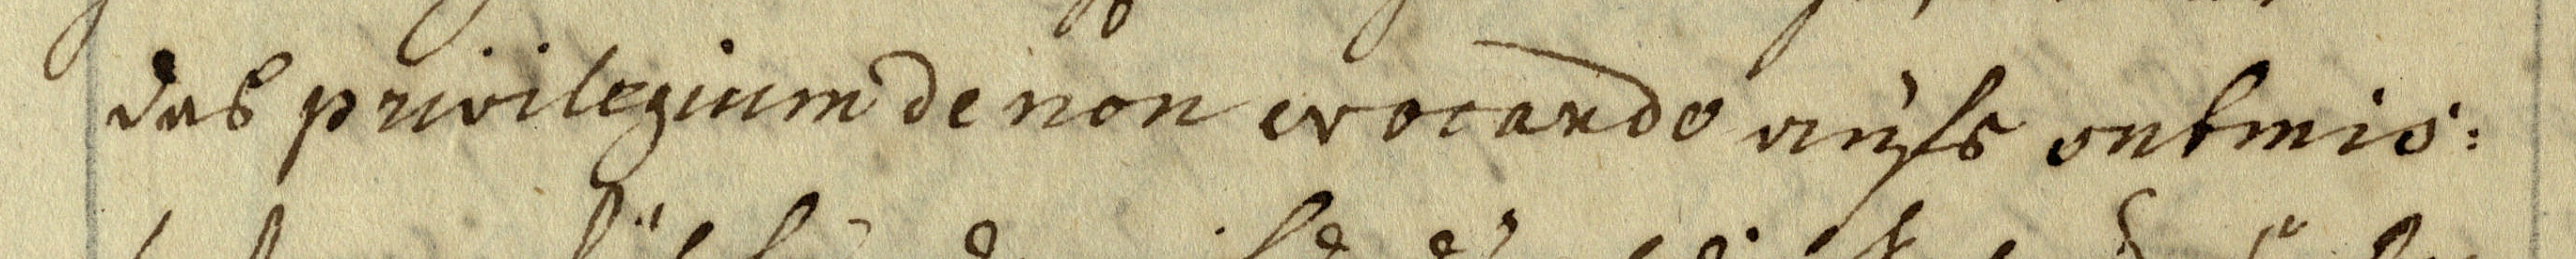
das privilegium de non evocando aufs submis¬
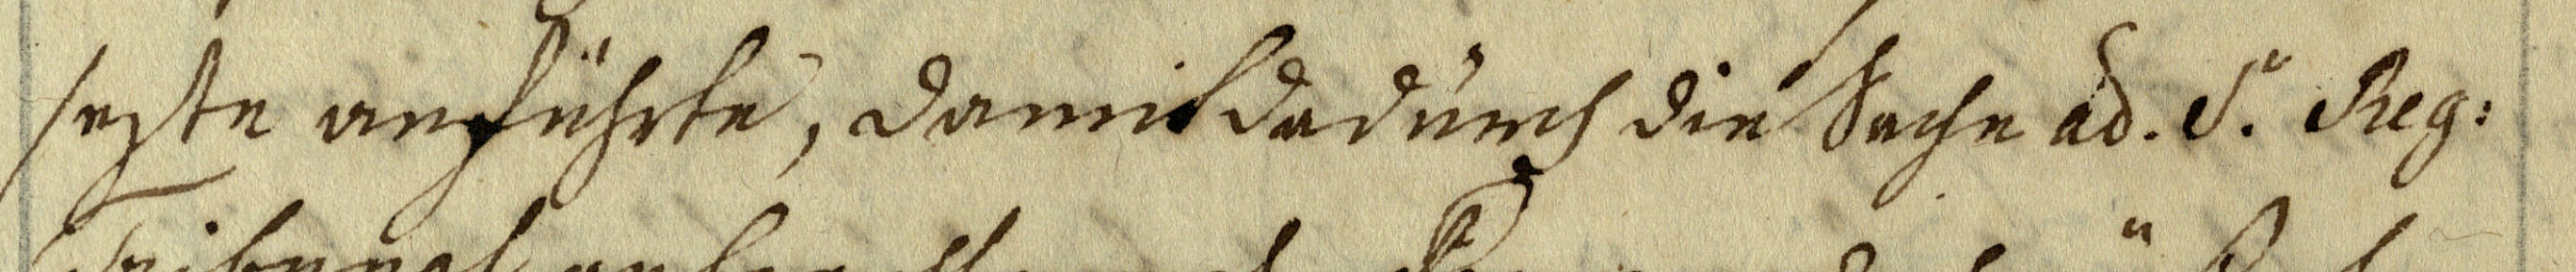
seste anführte, damit dadurch die Sache ad. S. Reg.
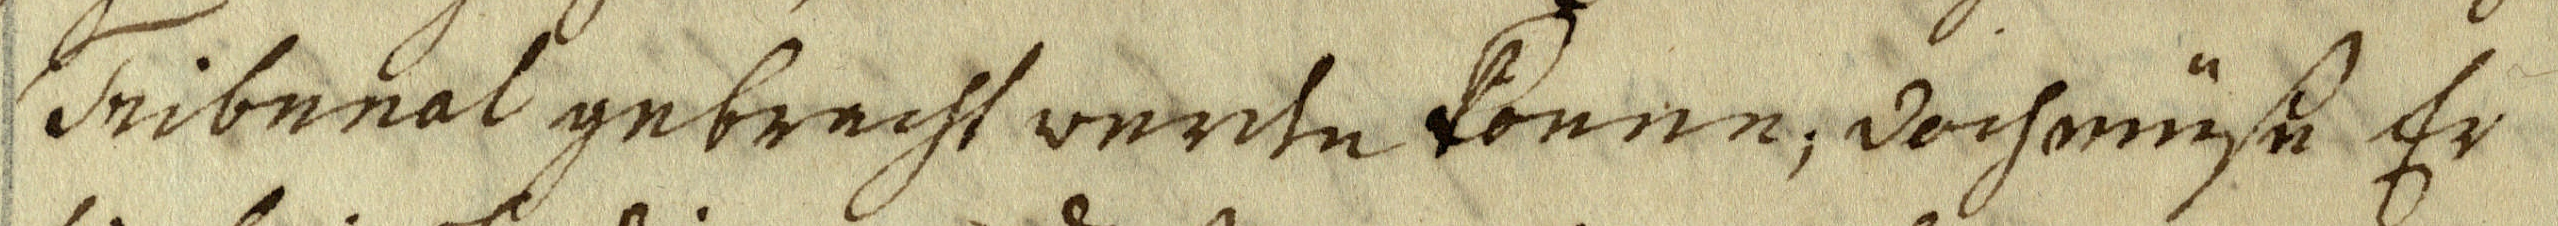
Tribunal gebracht werden könne, doch müße Er
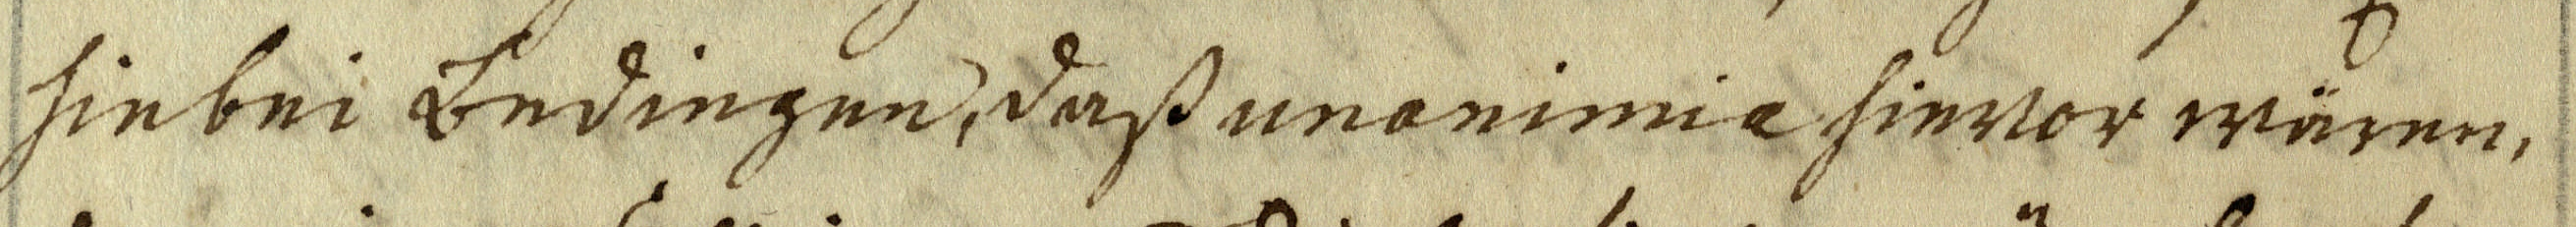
hiebei bedingen, daß unanimia hievor wären,
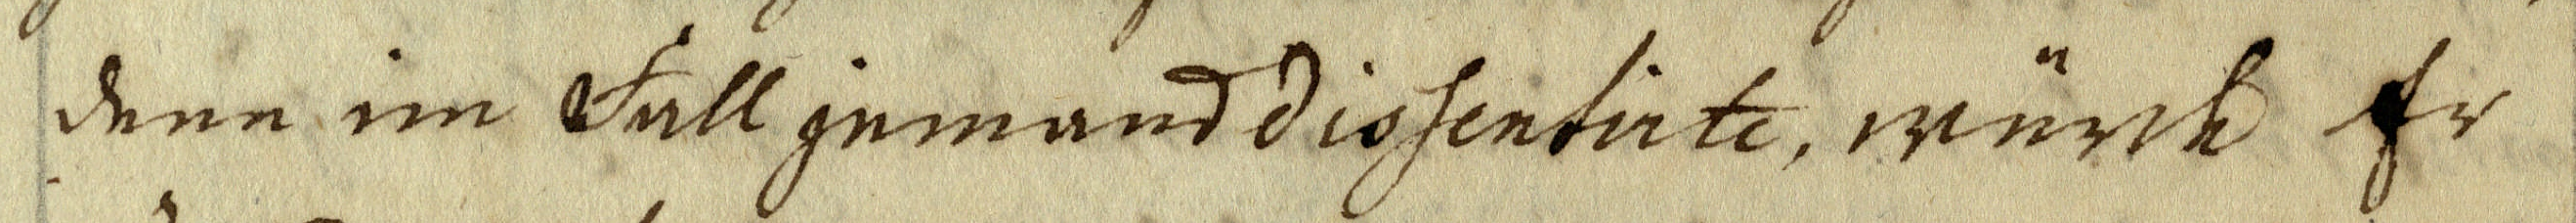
denn im Fall jemand dissentirte, würde Er
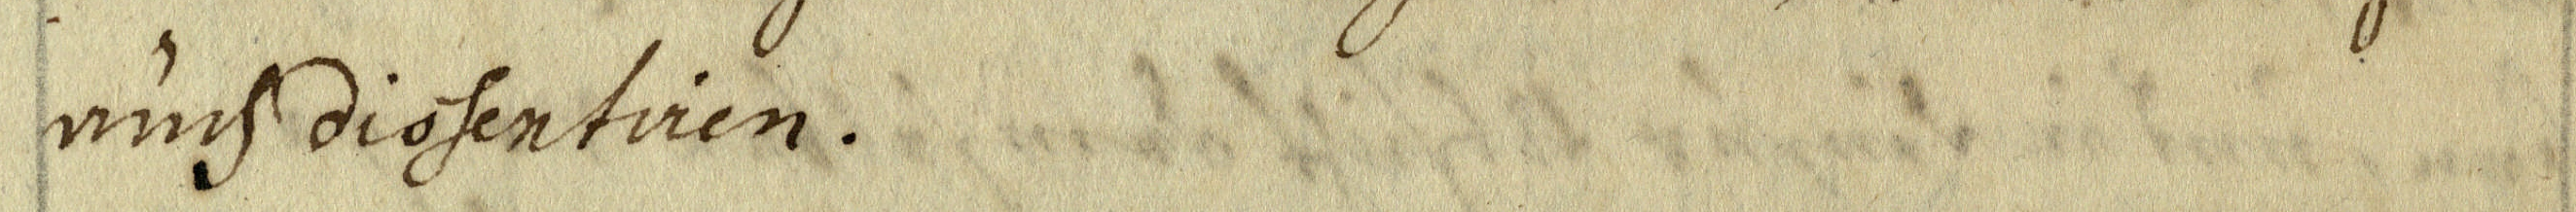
auch dissentiren.
